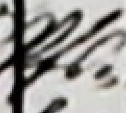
Pfs„
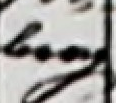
berg
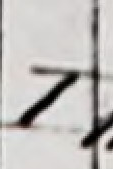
I
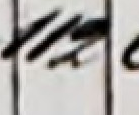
112
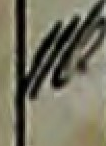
116
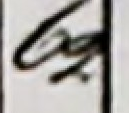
62
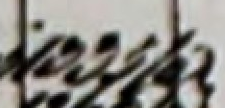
1335/a
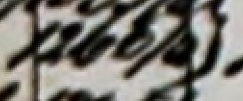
1260/a
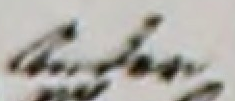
An der
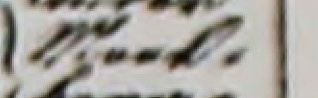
Mars„
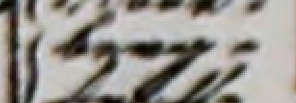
berg„
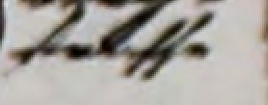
strafe
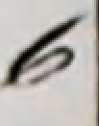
6
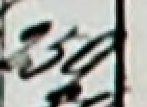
250
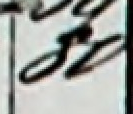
80
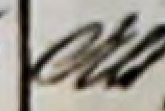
Alt
